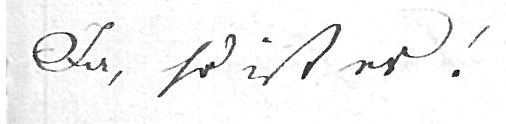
Ja, so ist es!
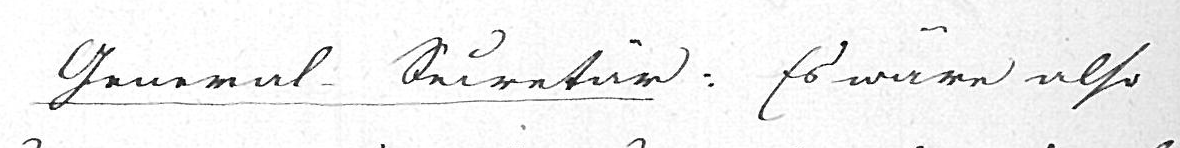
General-Secretär: Es wäre also
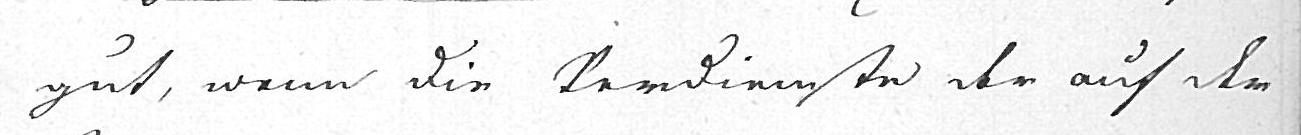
gut, wenn die Verdienste der auf der
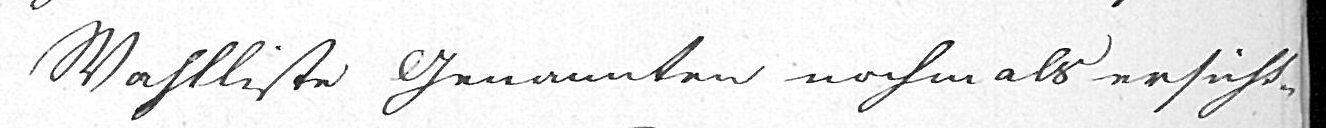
Wahlliste Genannten nochmals ersicht-
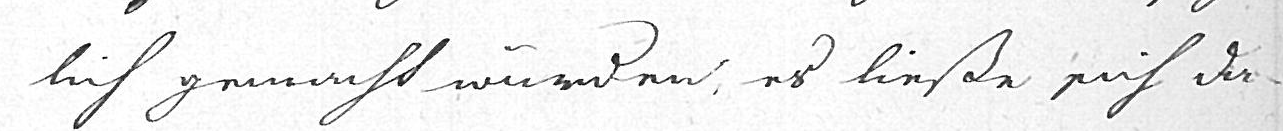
lich gemacht würden, es ließe sich da-
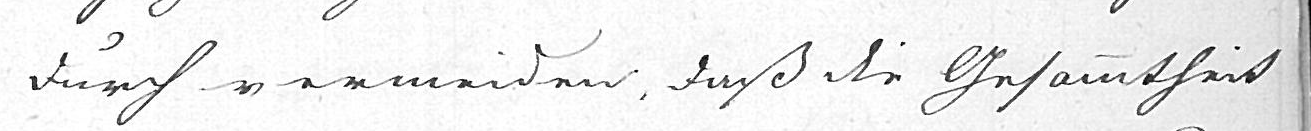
durch vermeiden, daß die Gesammtheit
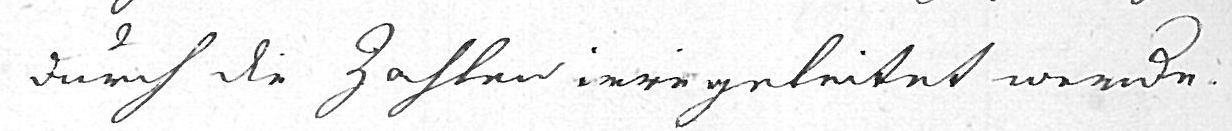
durch die Zahlen irrgeleitet werden.
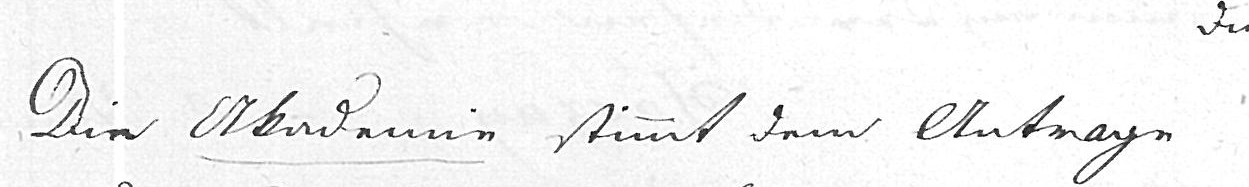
Die Akademie stimmt dem Antrage
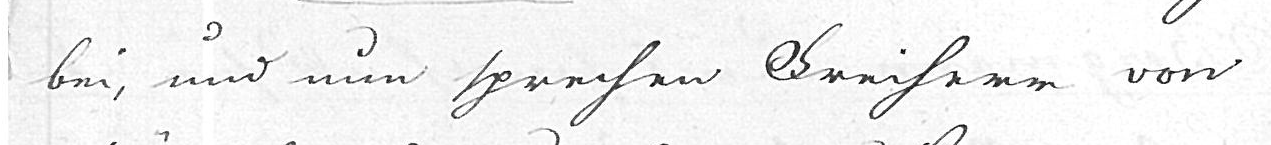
bei, und nun sprechen Freiherr von
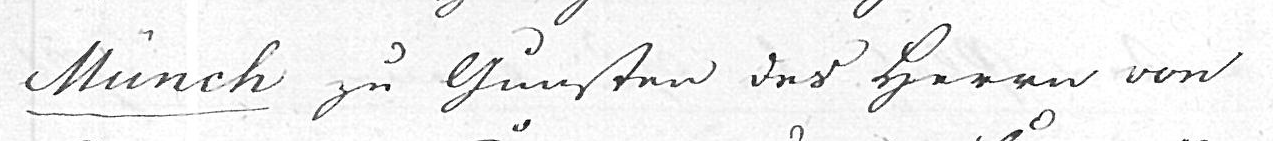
Münch zu Gunsten des Herrn von
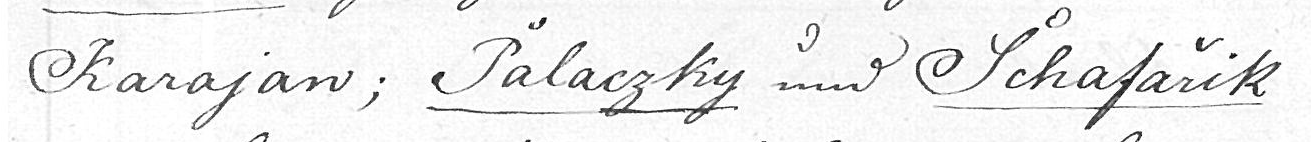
Karajan; Palaczky und Schafarik
